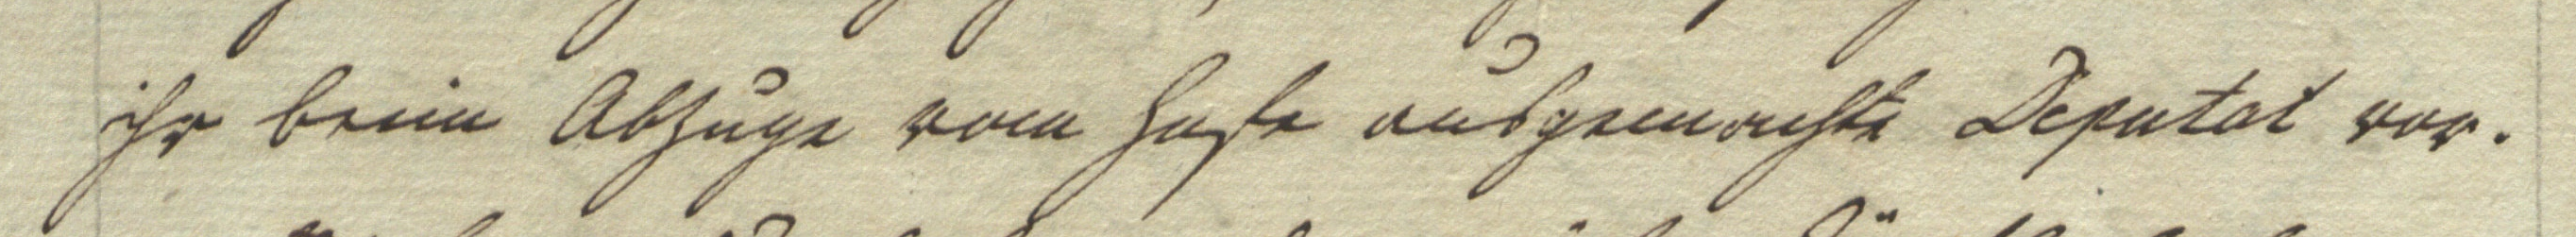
ihr beim Abzuge vom Hofe ausgemachte Deputat vor-
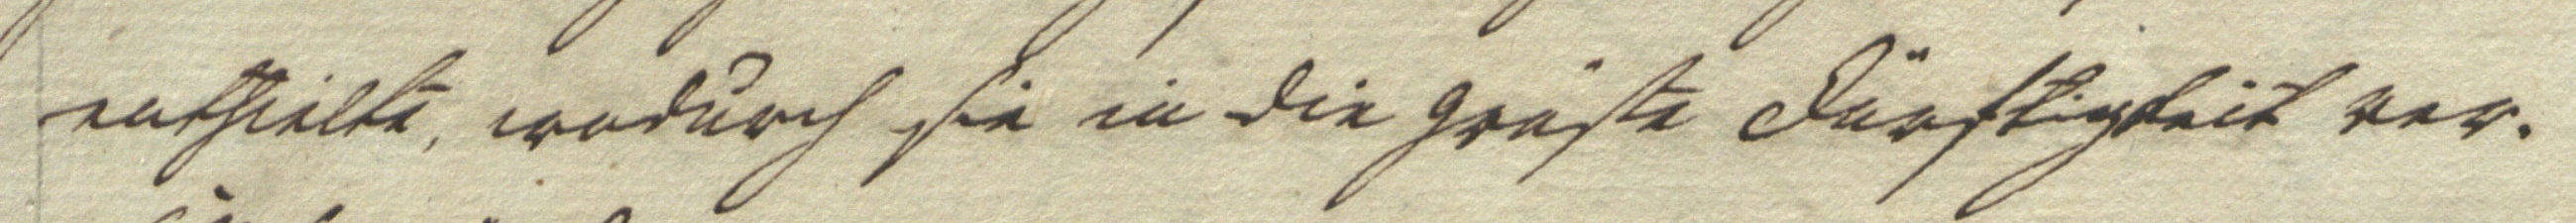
enthielte, wodurch sie in die größte Dürftigkeit ver-
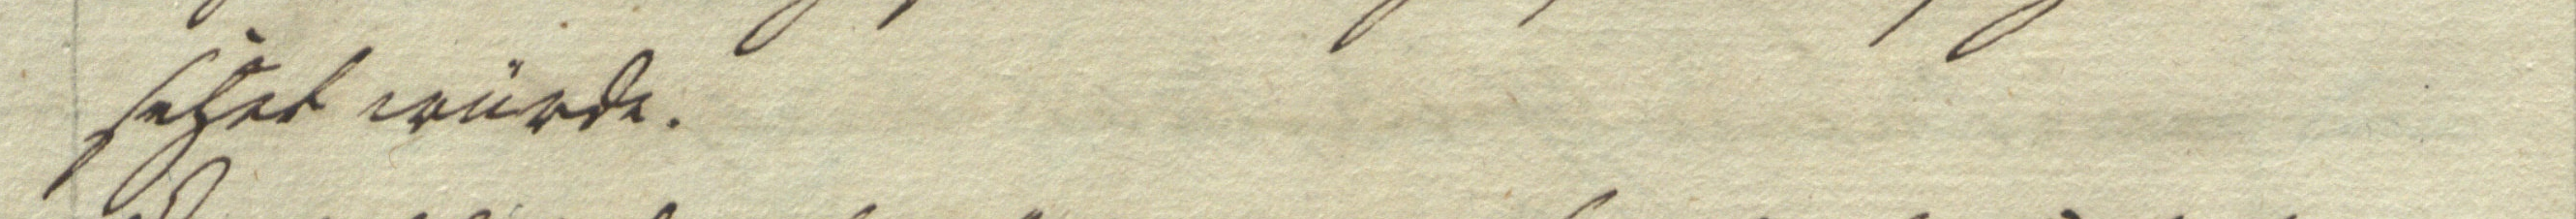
setzet würde.
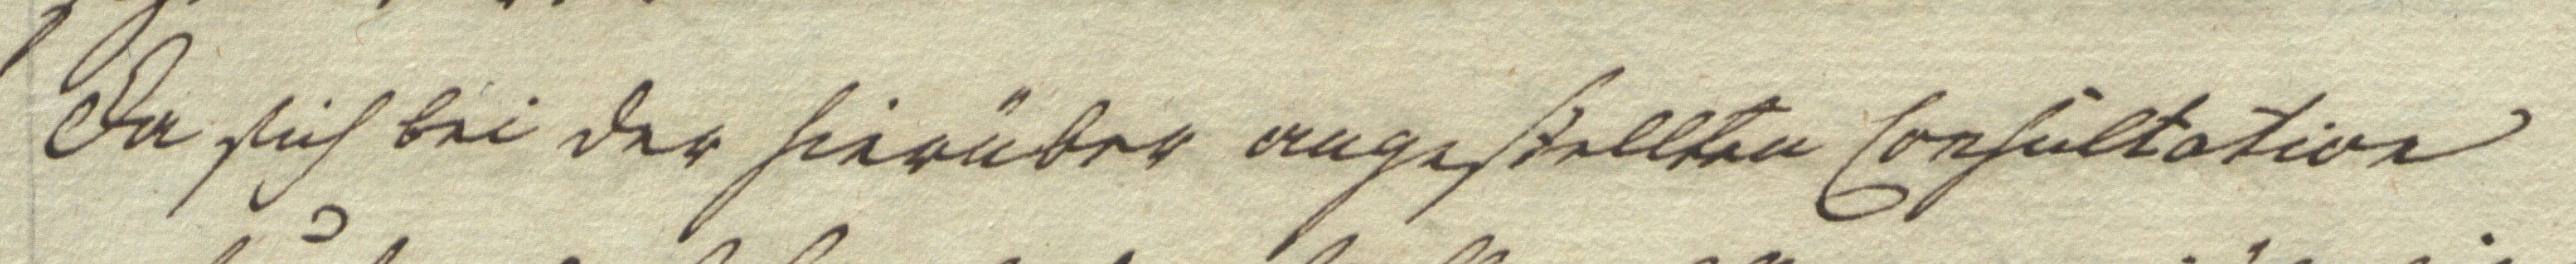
Da sich bei der hierüber angestellten Consultation
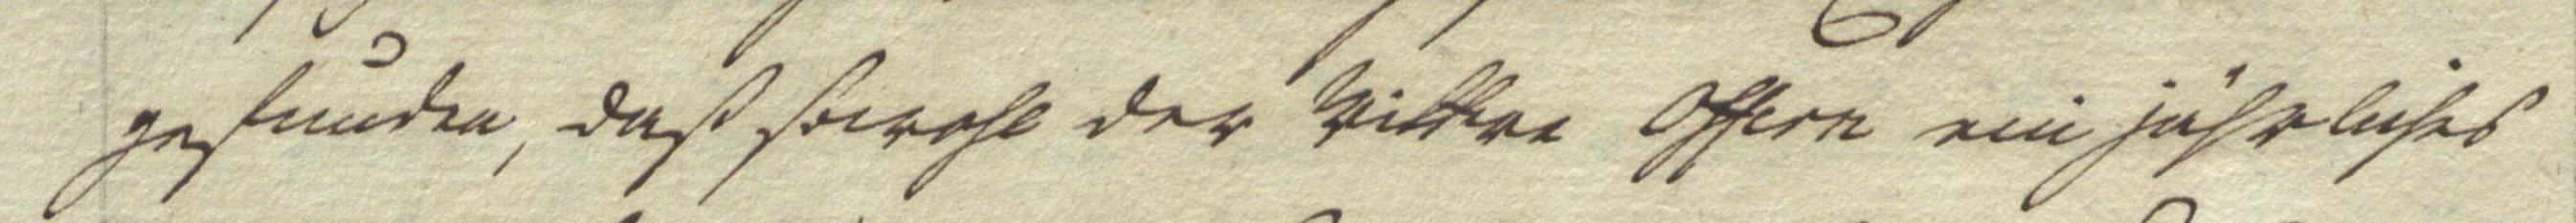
gefunden, daß sowohl der Wittwe Offern ein jährliches
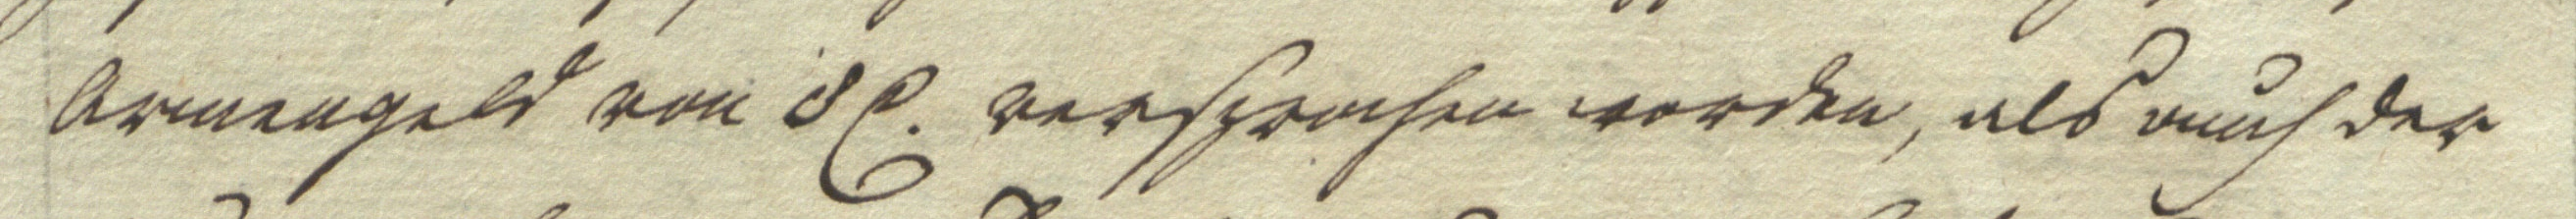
Armengeld von 8 rtl. versprochen worden, als auch der
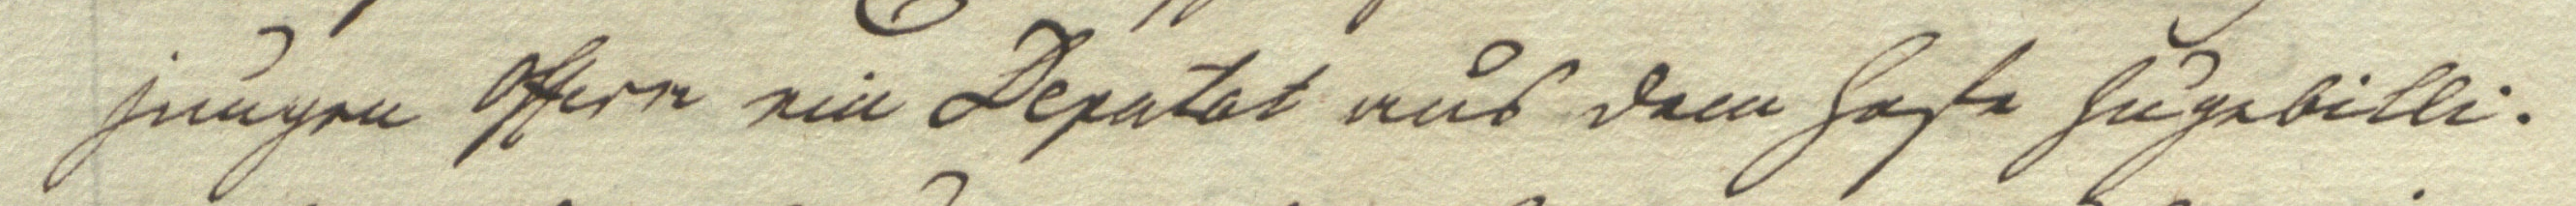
jungen Offern ein Deputat aus dem Hofe zugebilli¬
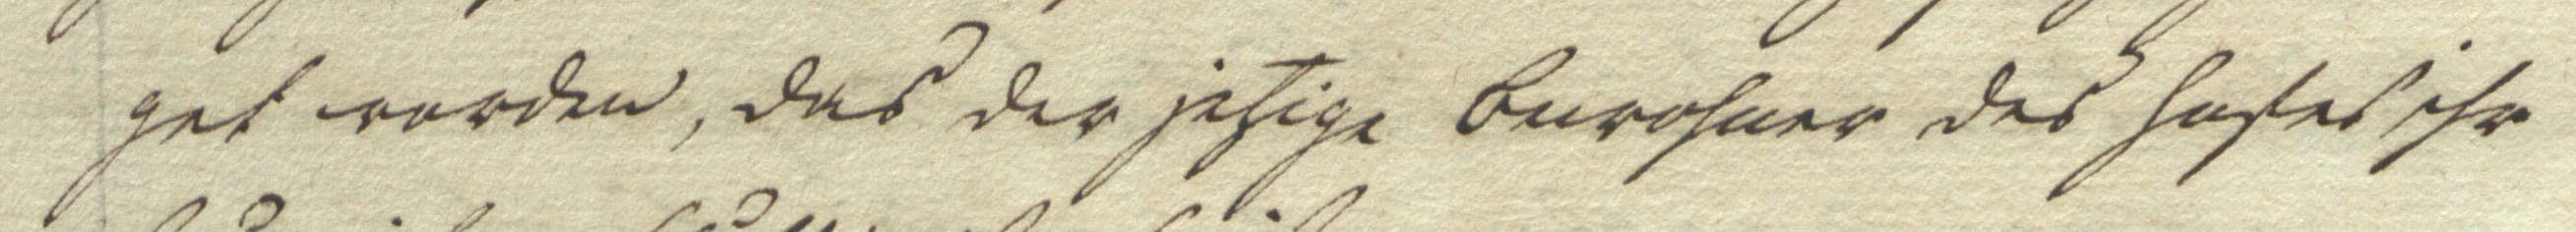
get worden, das der jetzige Bewohner des Hofes ihr
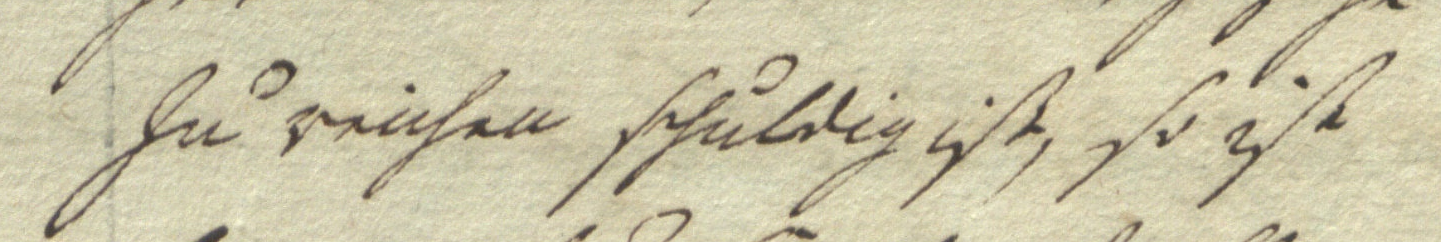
zu reichen schuldig ist, so ist
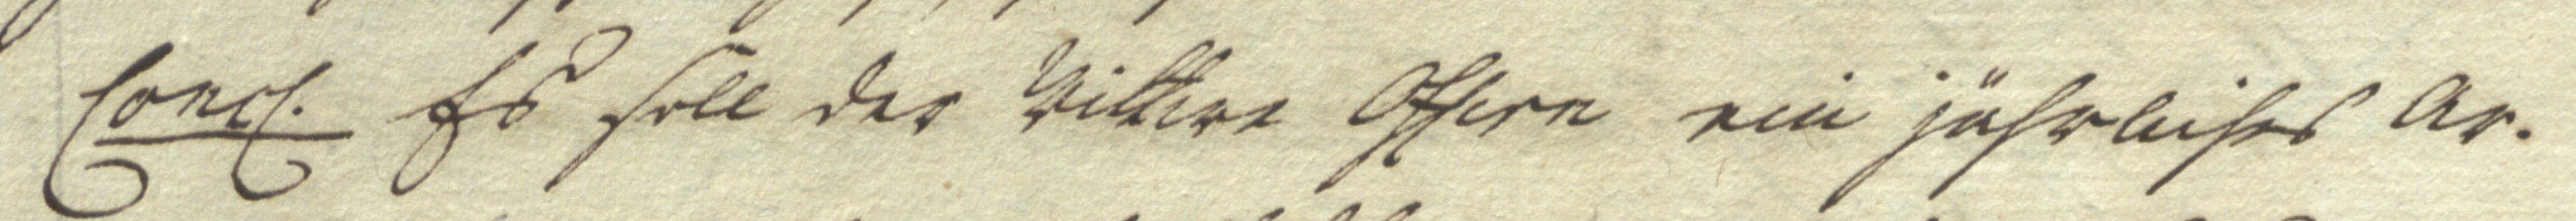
Concl. Es soll der Wittwe Offern ein jährliches Ar¬
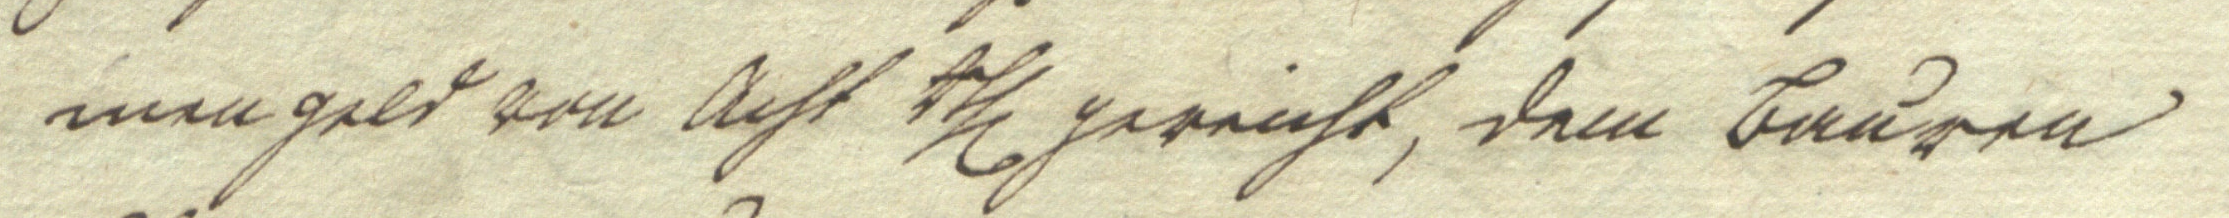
mengeld von Acht Rthl. greicht, dem Bauren
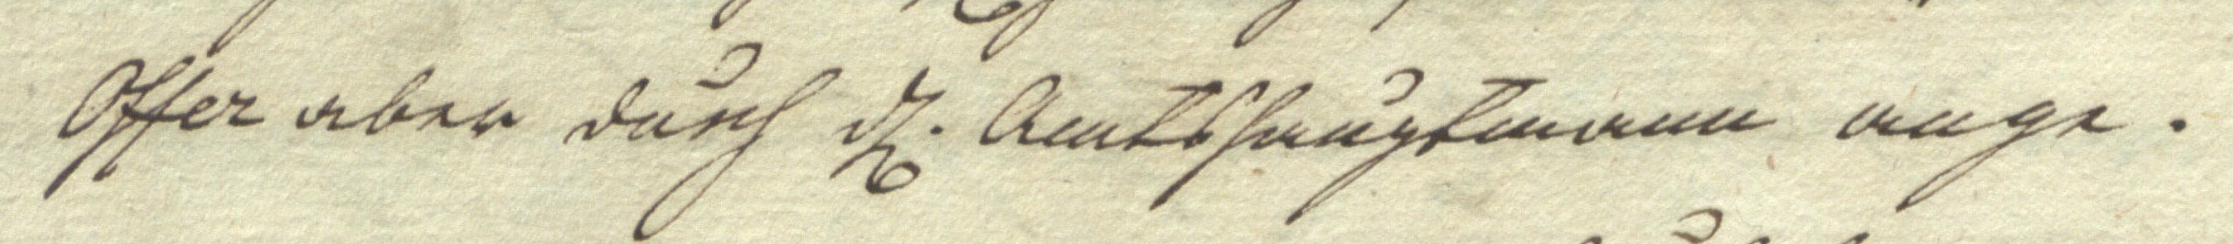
Offer aber durch dh. Amtshauptmann ange¬
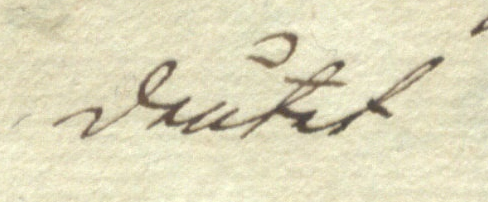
deutet
